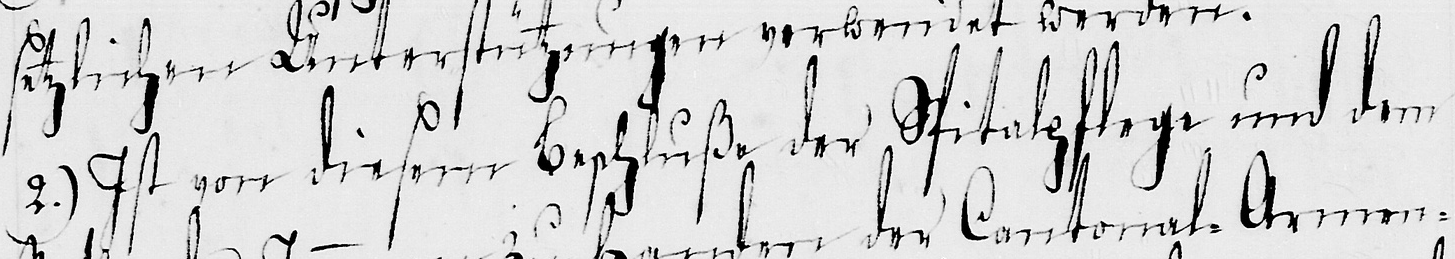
2.) Ist von diesem Beschluße der Spitalpflege und dem
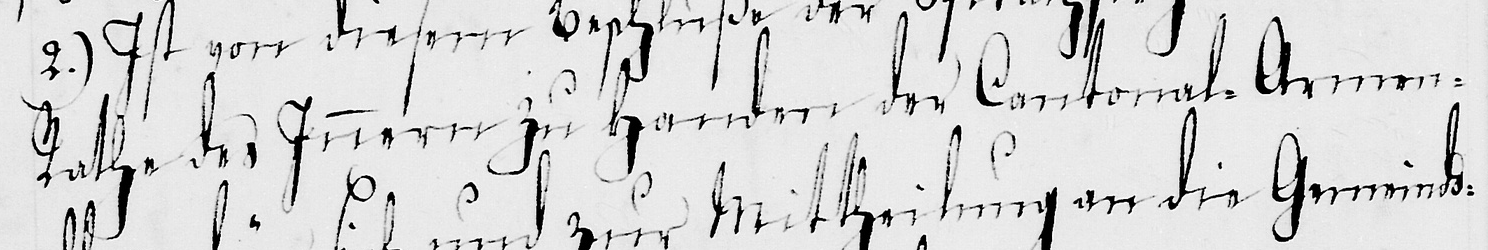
Rathe des Innern zu Handen der Cantonal-Armen¬
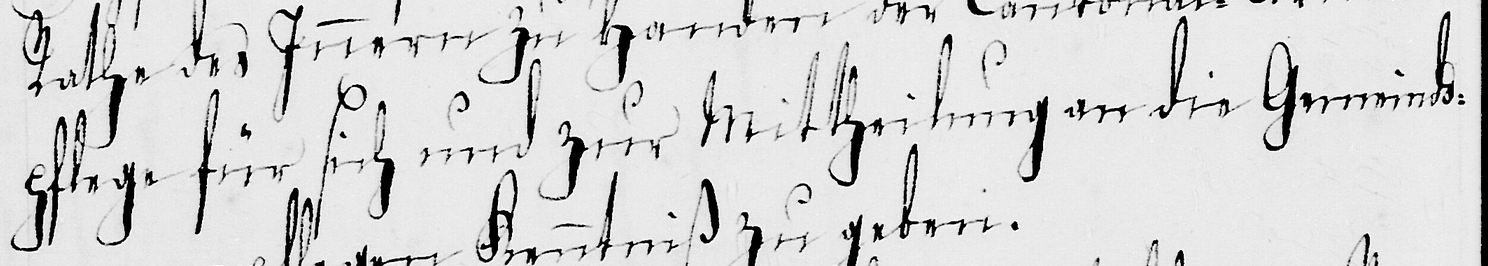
pflege für sich und zur Mittheilung an die Gemeind¬
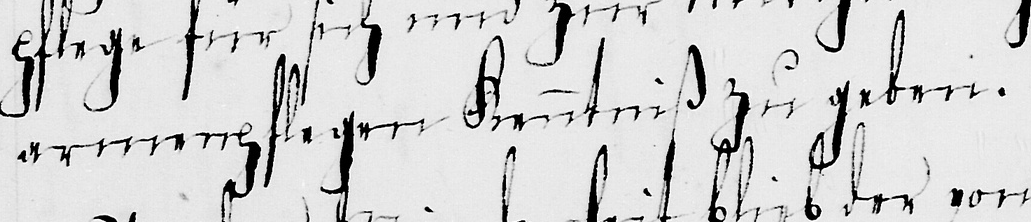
sarmenpflegen Kenntniß zu geben.
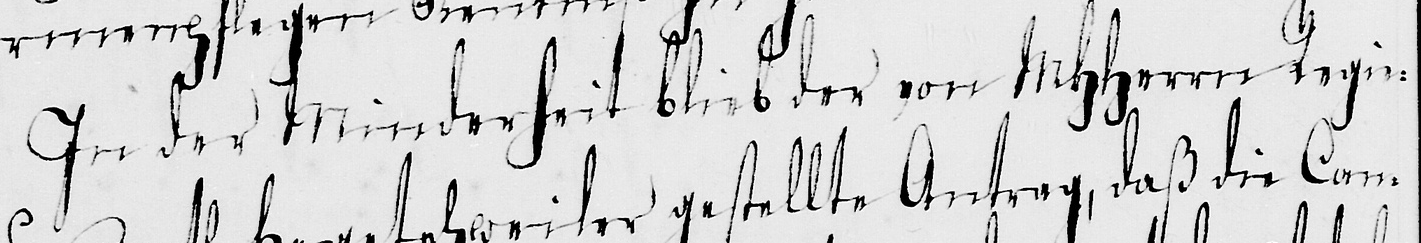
In der Minderheit blieb der von MHHerrn Regie¬
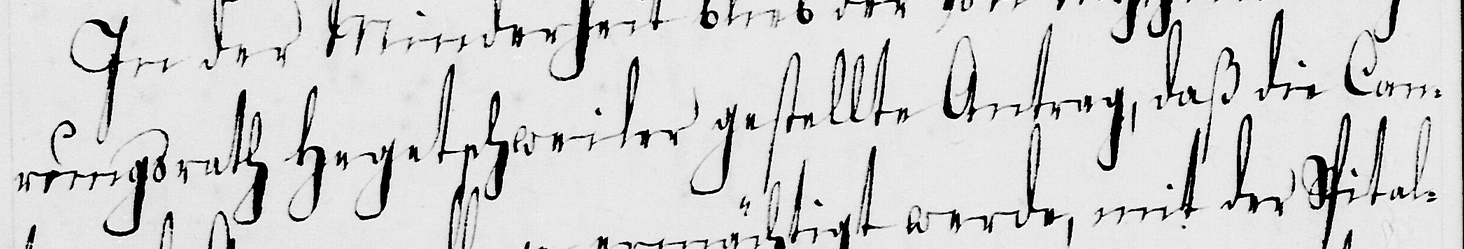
rungsrath Hegetschweiler gestellte Antrag, daß die Can¬
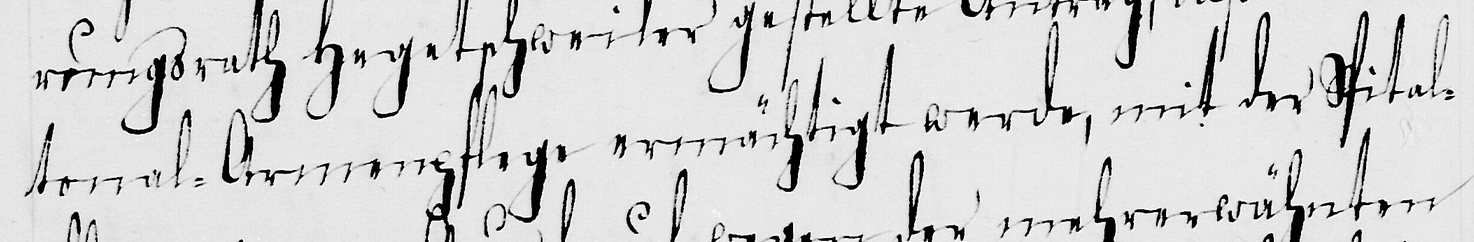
tonal-Armenpflege ermächtigt werde, mit der Spital¬
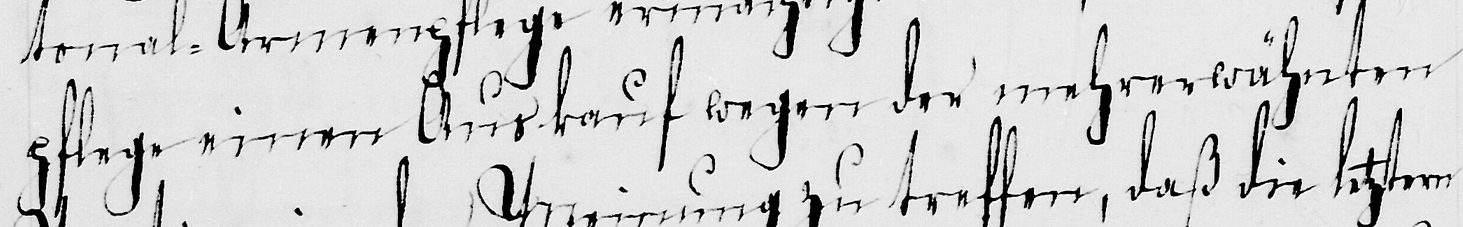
pflege einen Auskauf wegen der mehrerwähnten
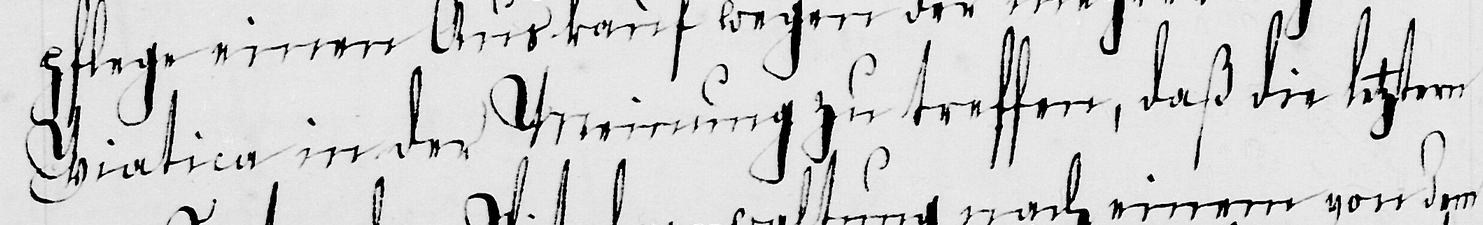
Viatica in der Meinung zu treffen, daß die letzte¬
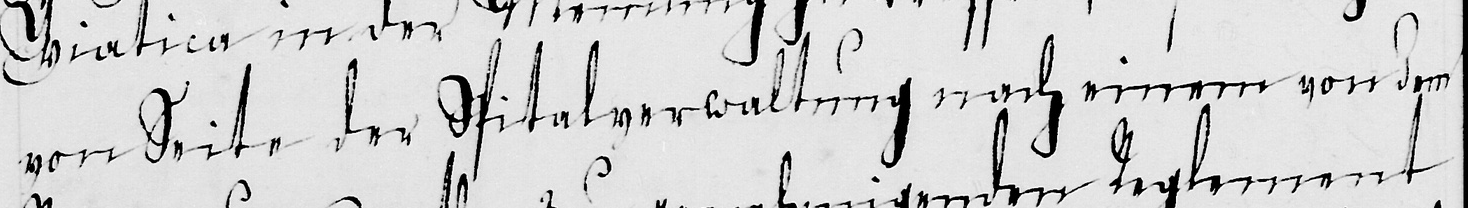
von Seite der Spitalverwaltung nach einem von dem
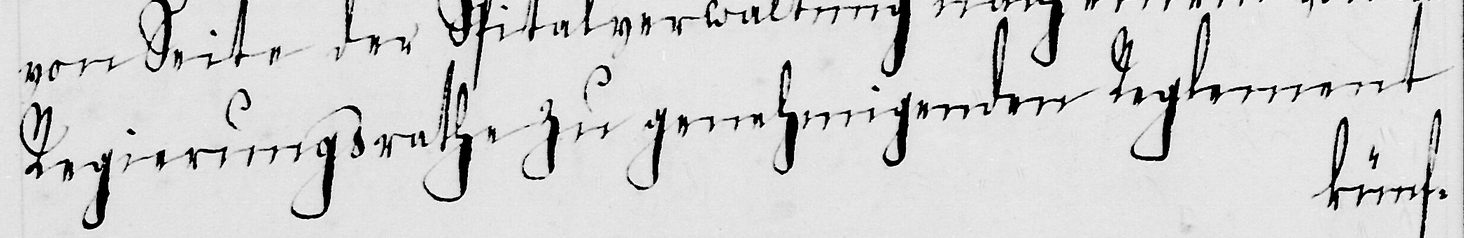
Regierungsrathe genehmigenden Reglement
